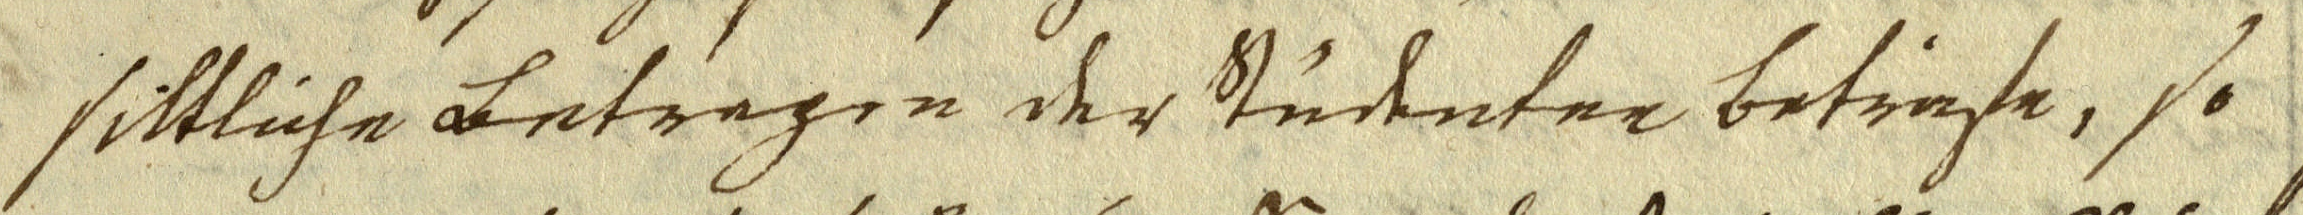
sittliche Betragen der Studenten beträfe, so
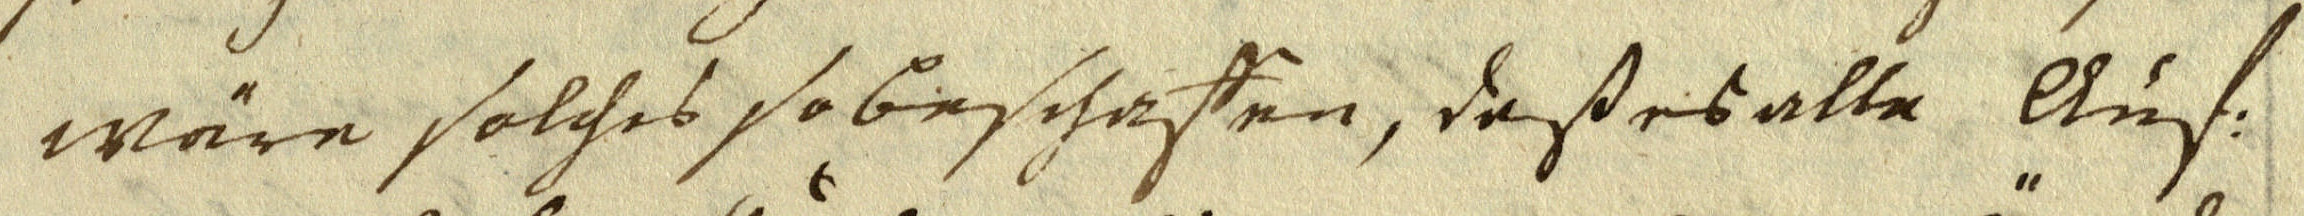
wäre solches so beschaffen, daß es alle Auf¬
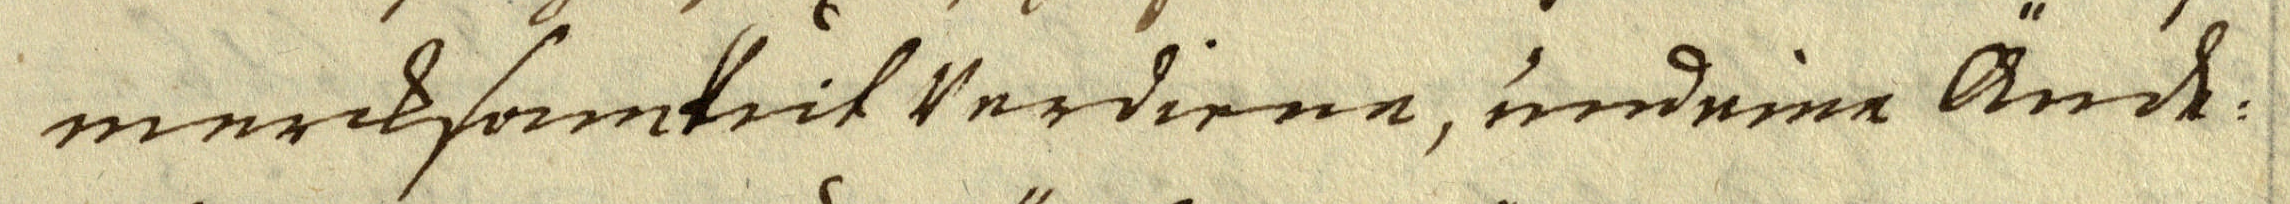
mercksamkeit verdiene, und eine Ände¬
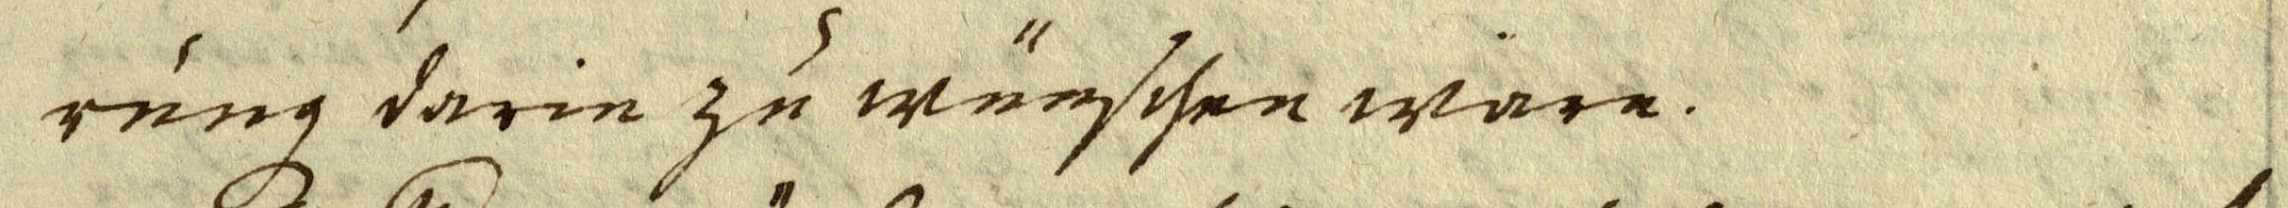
rung darin zu wünschen wäre.
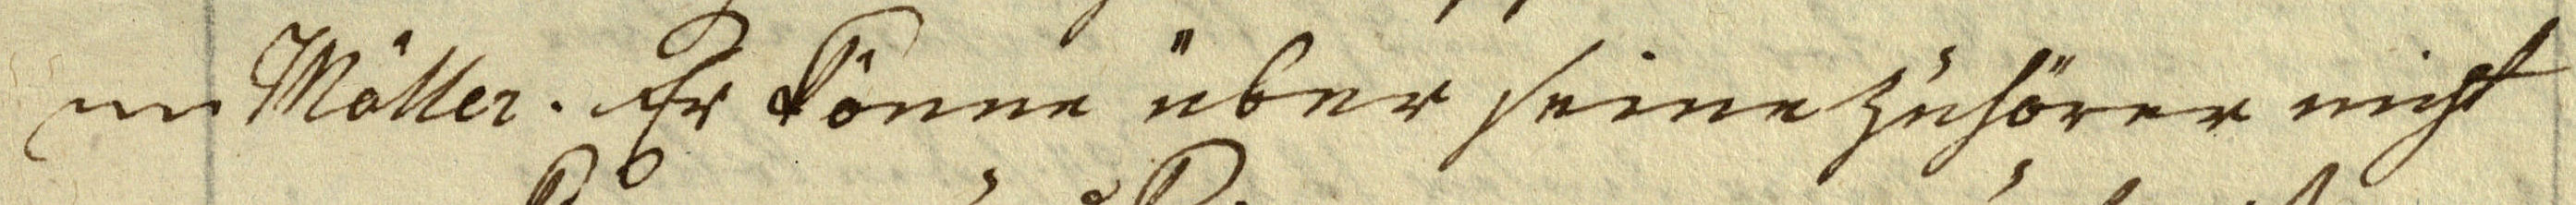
Möller. Er könne über seine Zuhörer nicht
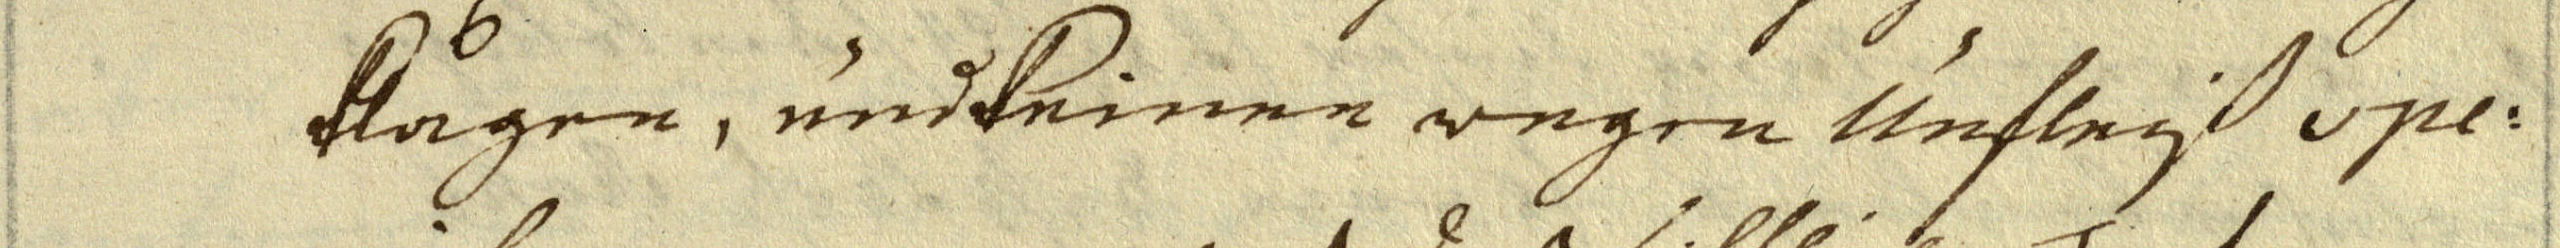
klagen, und keinen wegen Unfleiß spe¬
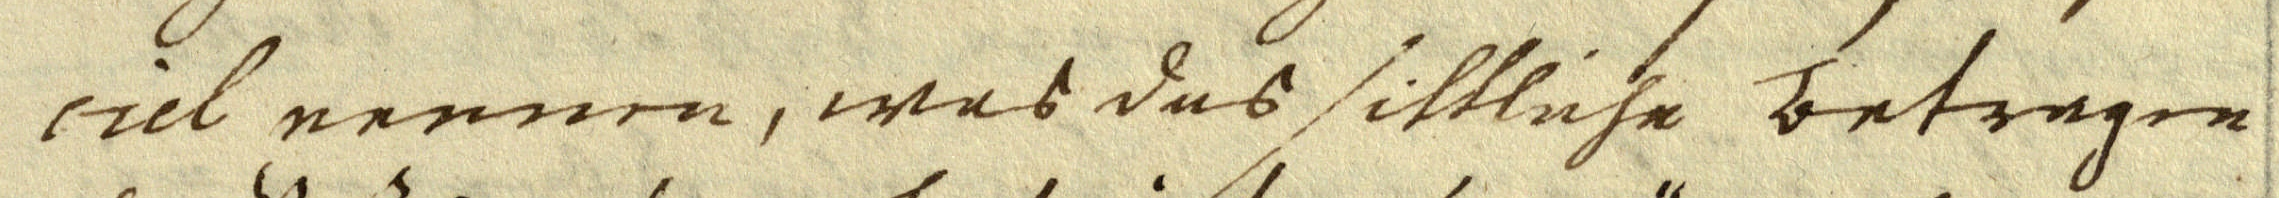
ciel nennen, was das sittliche Betragen
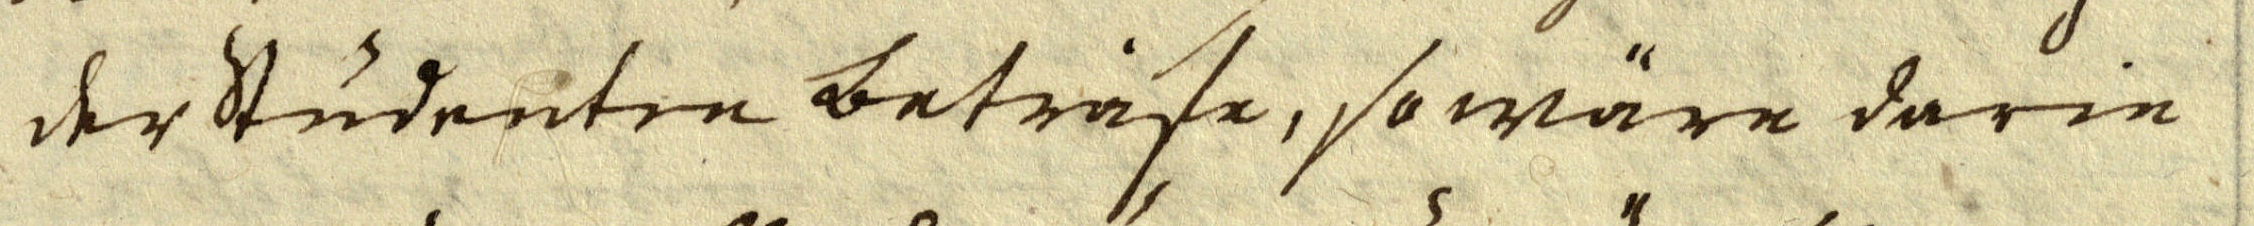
der Studenten beträfe, so wäre darin
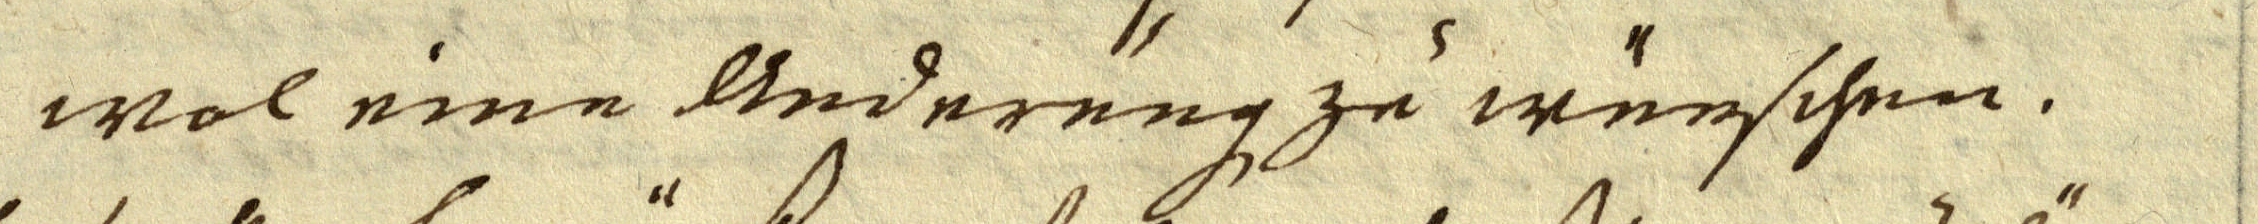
wol eine Anderung zu wünschen.
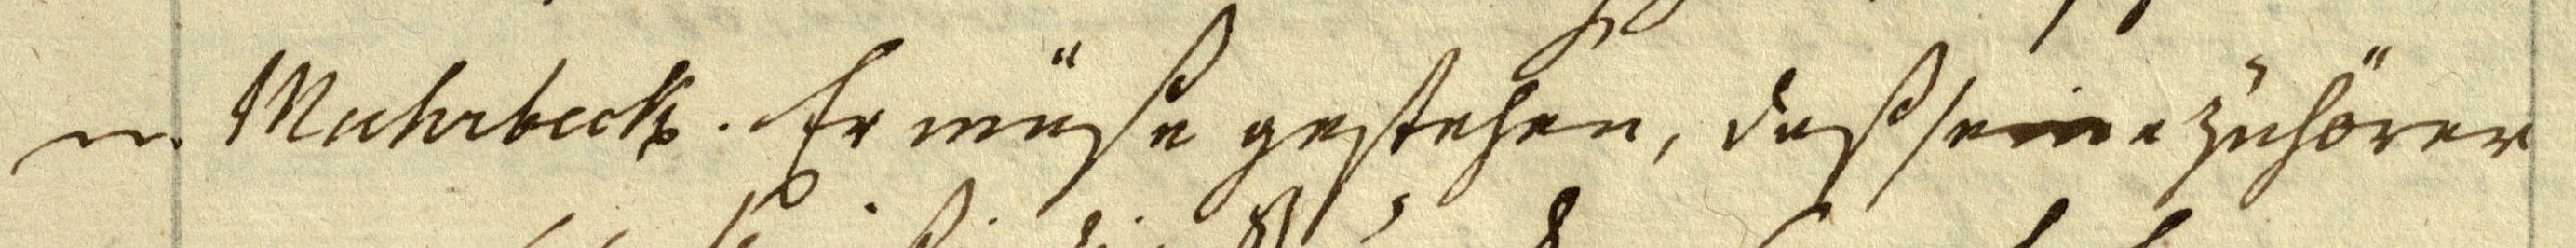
Muhrbeck. Er müße gestehen, daß seine Zuhörer
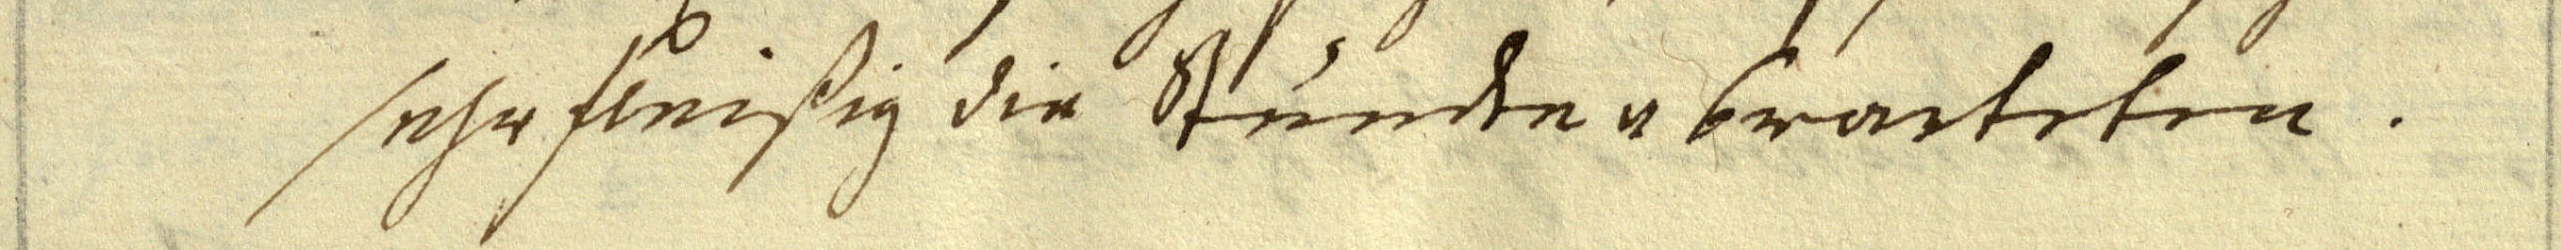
sehr fleißig die Stunden a bwarteten.
